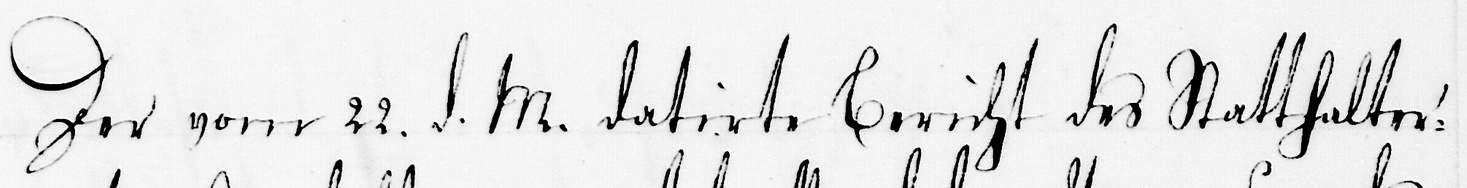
Der vom 22. d. M. datirte Bericht des Statthalter¬
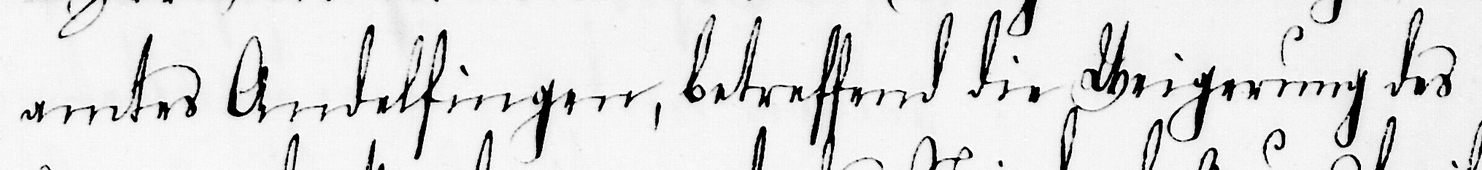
amtes Andelfingen, betreffend die Weigerung des
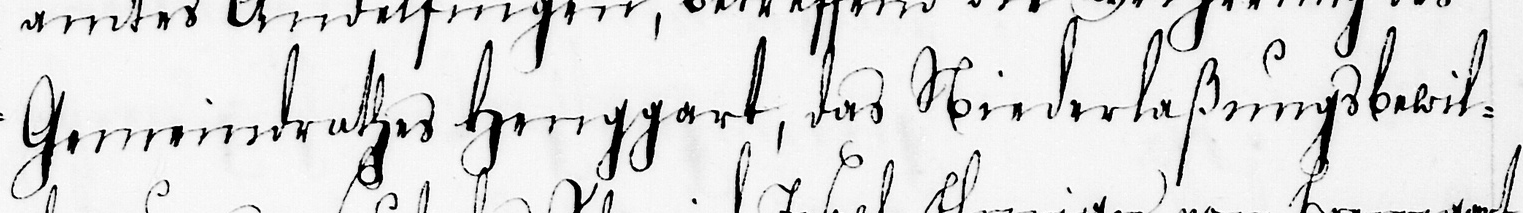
Gemeindrathes Henggart, das Niederlaßungsbewil¬
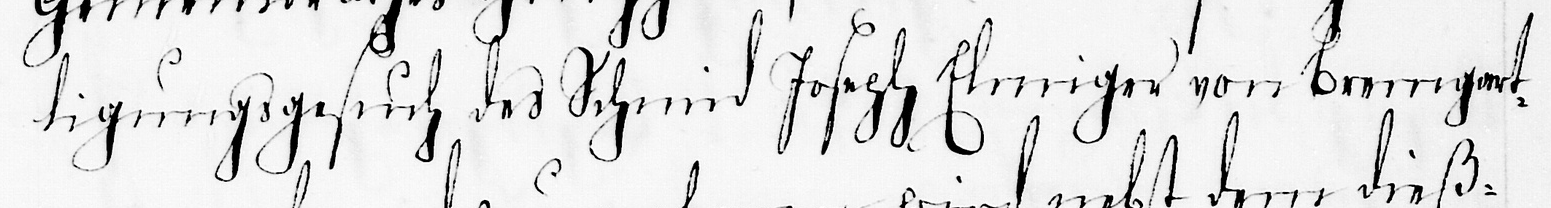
ligungsgesuch des Schmid Joseph Elmiger von Bremgart¬
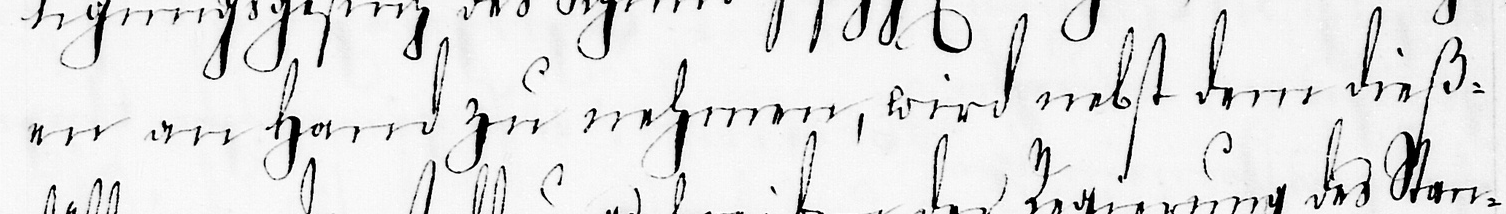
en an Hand zu nehmen, wird nebst dem dieß¬
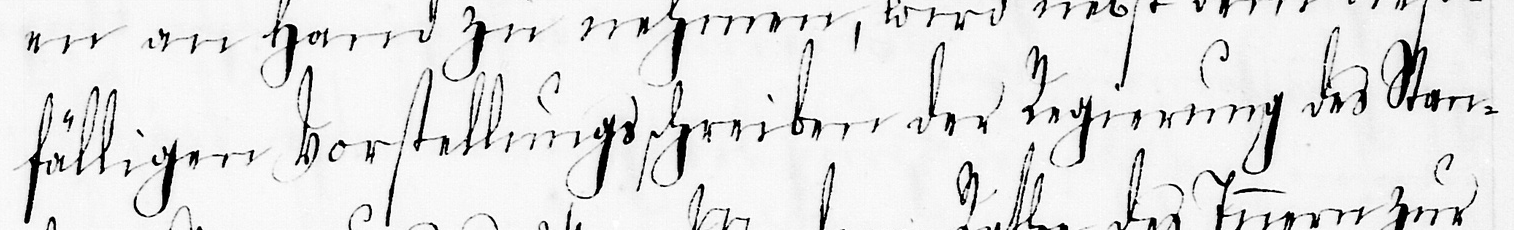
fälligen Vorstellungsschreiben der Regierung des Stan¬
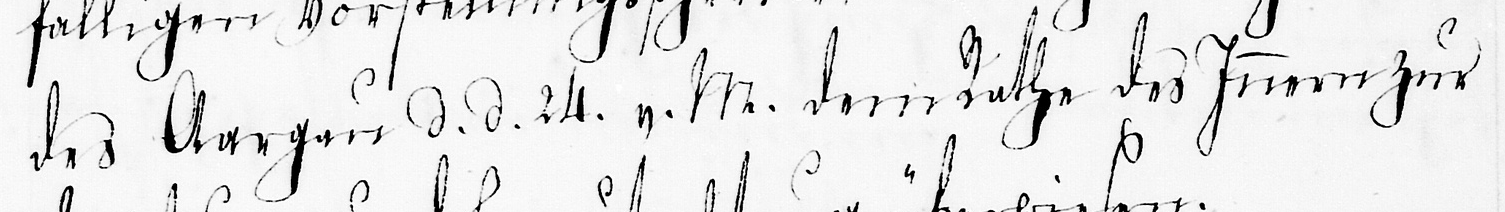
des Aargau d. d. 24. v. M. dem Rathe des Innern zur
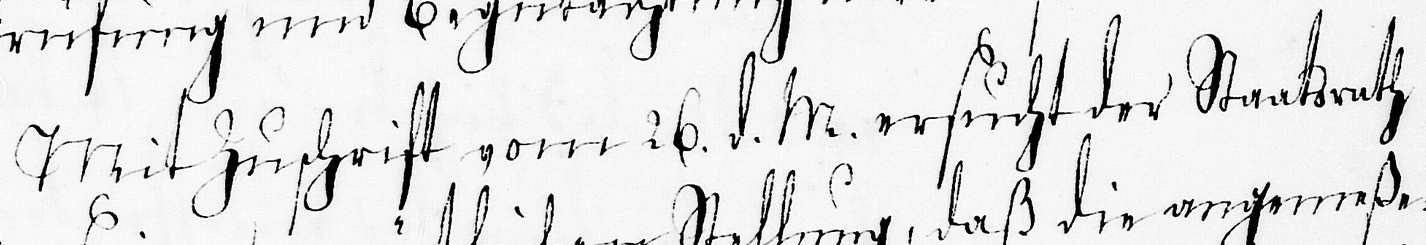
Mit Zuschrift vom 26. d. M. ersucht der Staatsrath
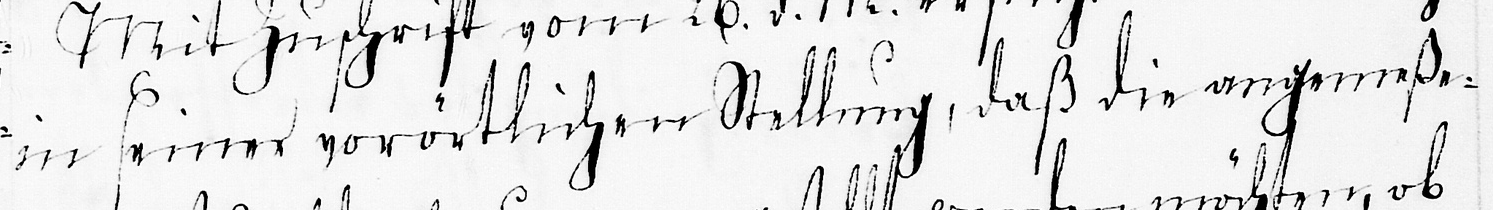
in seiner vorörtlichen Stellung, daß die angemeße¬
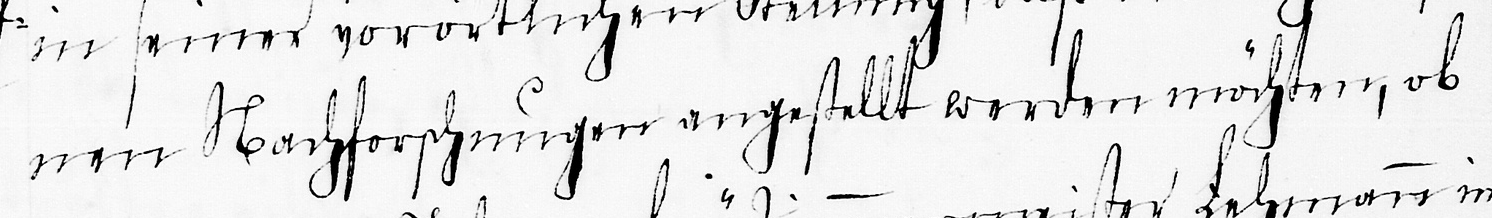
nen Nachforschungen angestellt werden möchten, ob
